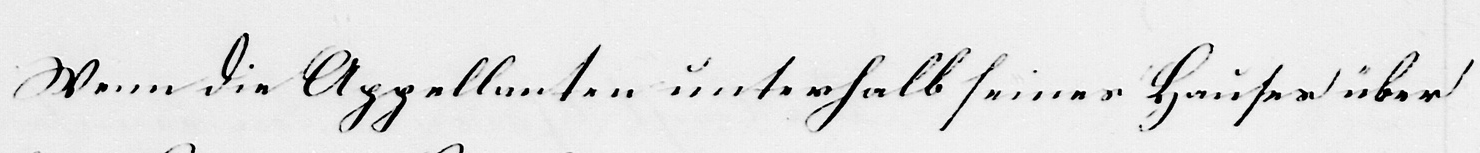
Wenn die Appellanten unterhalb seines Hauses über
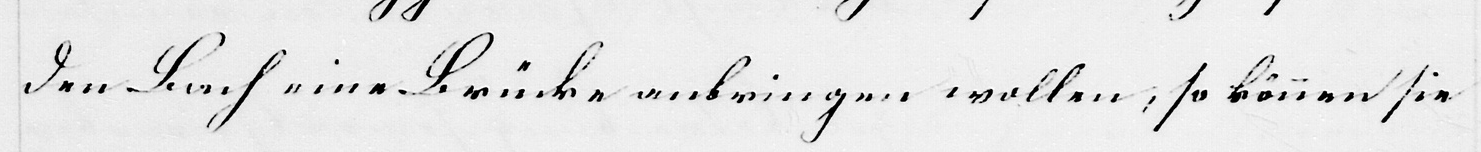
den Bach eine Brücke anbringen wollen, so können sie
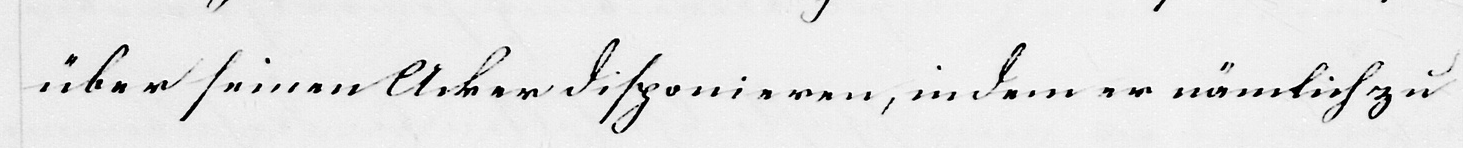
über seinen Acker disponieren, indem er nämlich zu
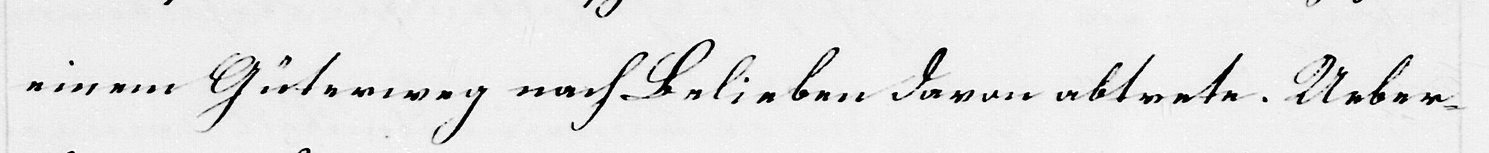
einem Güterweg nach Belieben davon abtrete. Ueber¬
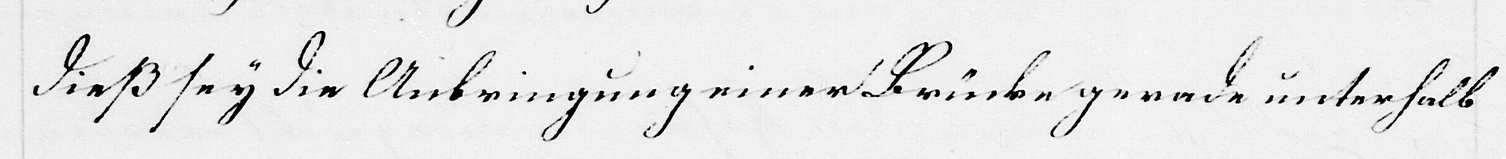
dieß sey die Anbringung einer Brücke gerade unterhalb
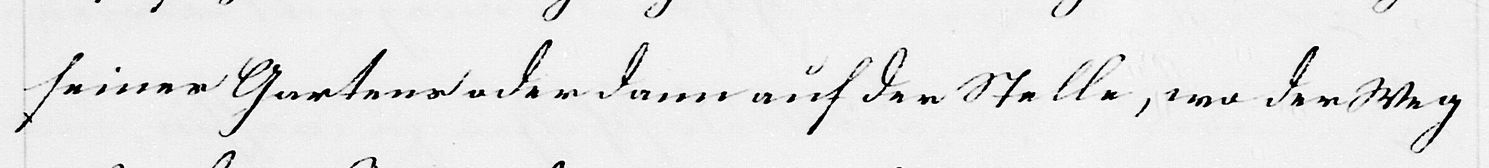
seines Gartens oder dann auf der Stelle, wo der Weg
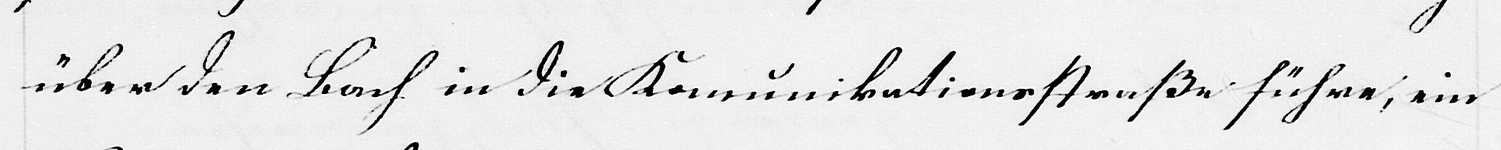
über den Bach in die Komunikationsstraße führe, ein
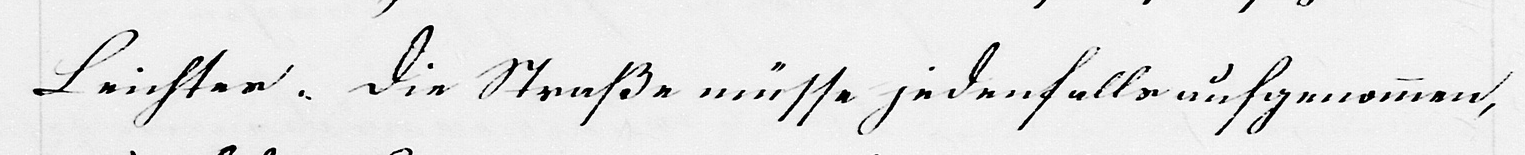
Leichtes. Die Straße müsse jedenfalls aufgenommen,
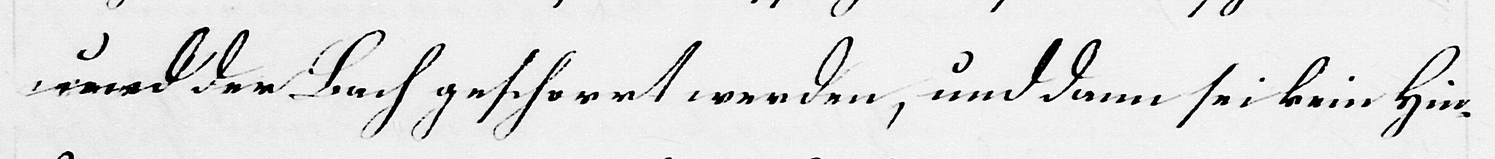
und der Bach geschorrt werden, und dann sei kein Hin¬
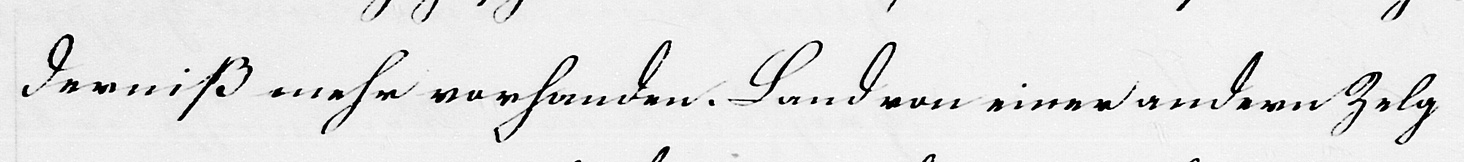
derniß mehr vorhanden. Land von einer andern Zelg
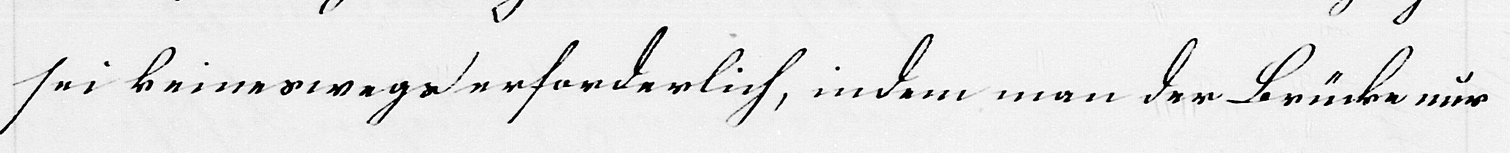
sei keineswegs erforderlich, indem man der Brücke nur
